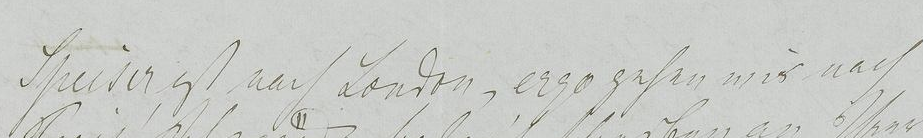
Speiser ist nach London, ergo gehen wir nach
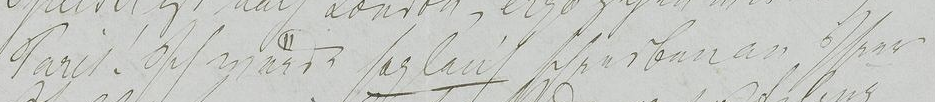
Paris! Ich würde sogleich schreiben an Ihrer
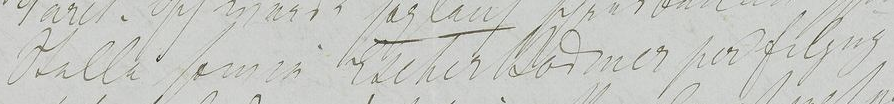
Stelle sowie Escher Bodmer per Eilzug
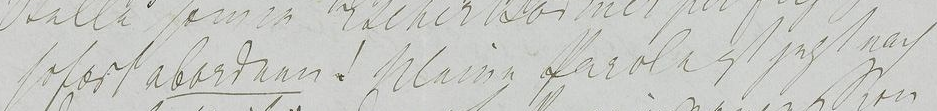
sofort abordnen! Meine Parole ist jezt nach
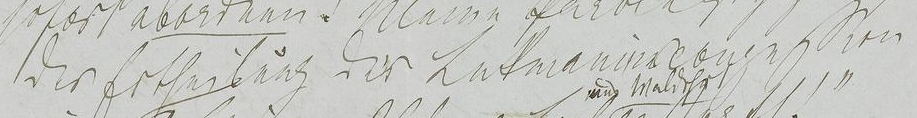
der Ertheilung der Lukmanierconzession
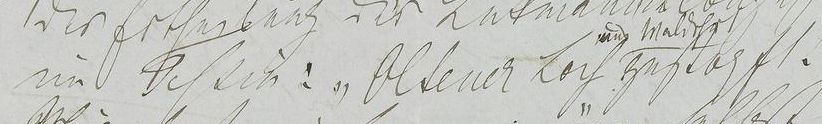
im Tessin: «Oltener Loch und Waldshut
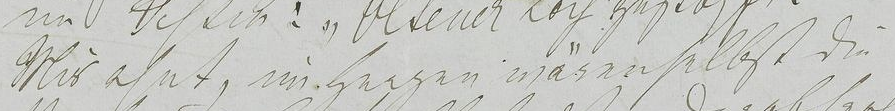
Mir ahnt, im Herzen wären selbst die
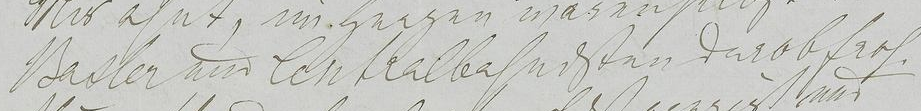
Basler und Centralbahnisten darob froh.
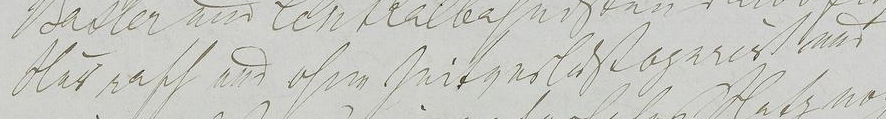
Nur rasch und ohne Zeitverlust operirt und
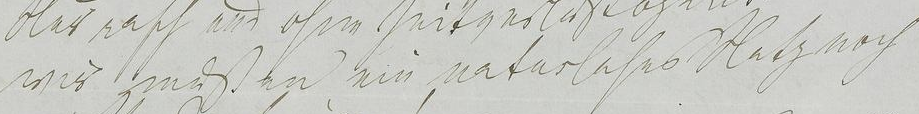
wir müßen ein natürliches Netz noch
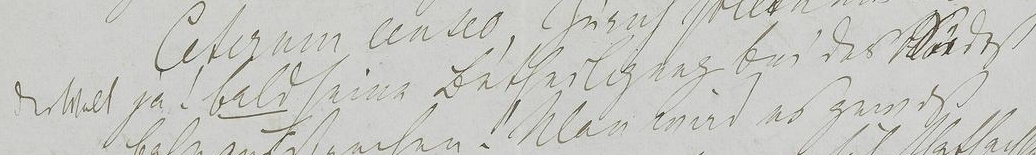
der Welt ja! bald seine Betheiligung bei der Südost-
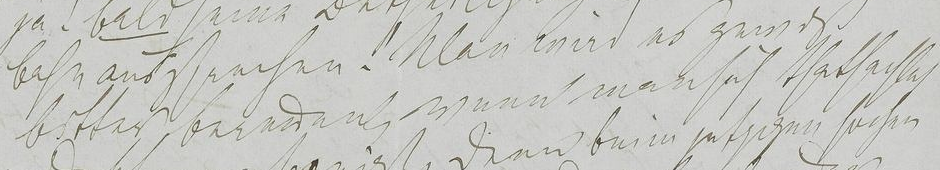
bitter bereuen, wenn man sich thatsächlich
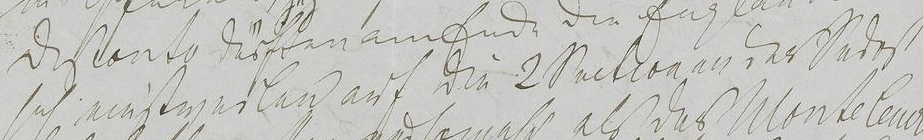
sich einstweilen auf die 2 Sectionen der Südost-
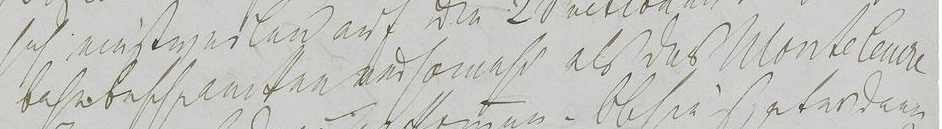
bahn beschräncken um so mehr als der Monte Cenere
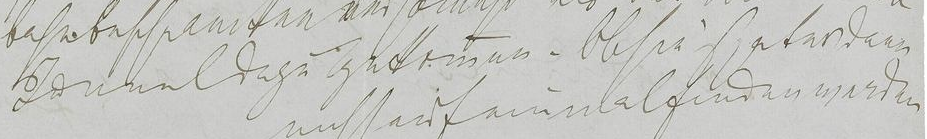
Tunnel dazu gekommen. Ob sie später dann
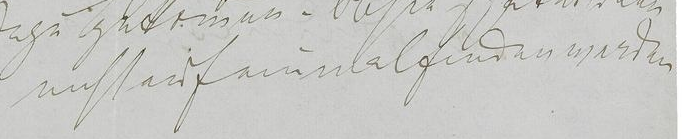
nicht auf einmal finden werden
